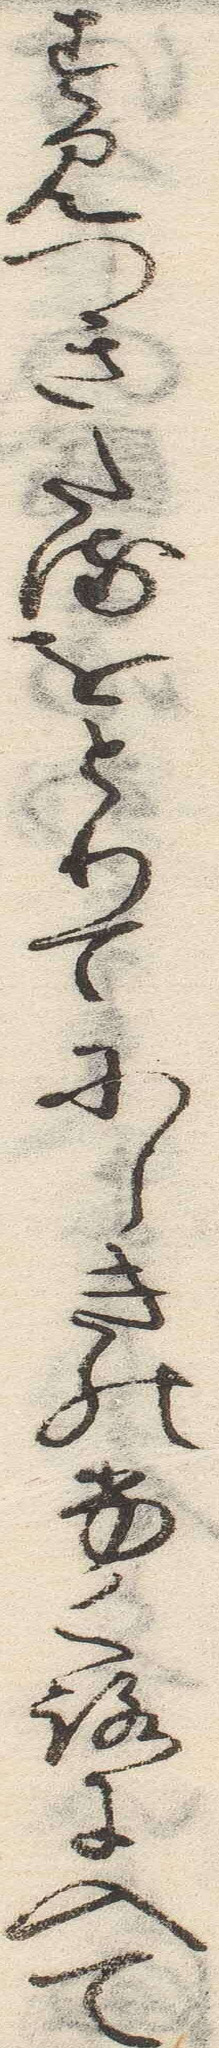すみつきたるをとりてにしきのふくろに入て
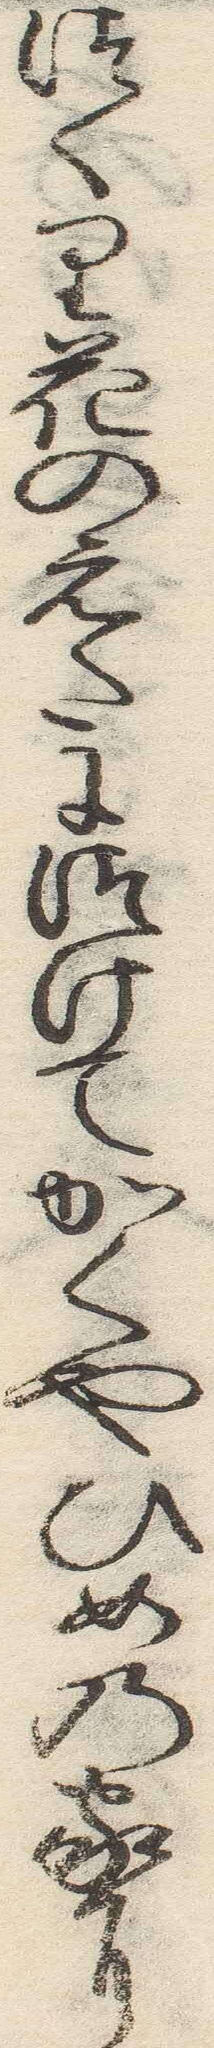つくり花のえたにつけてかくやひめの家に
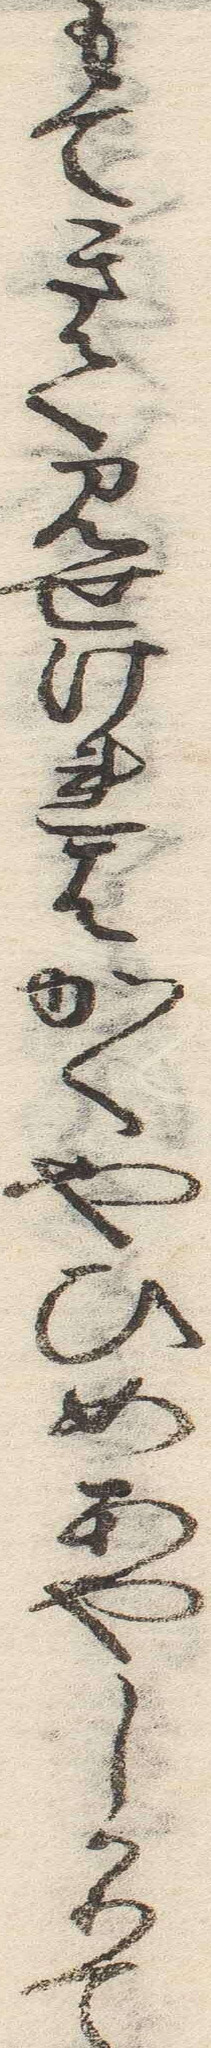もてきて見せけれはかくやひめあやしかりて
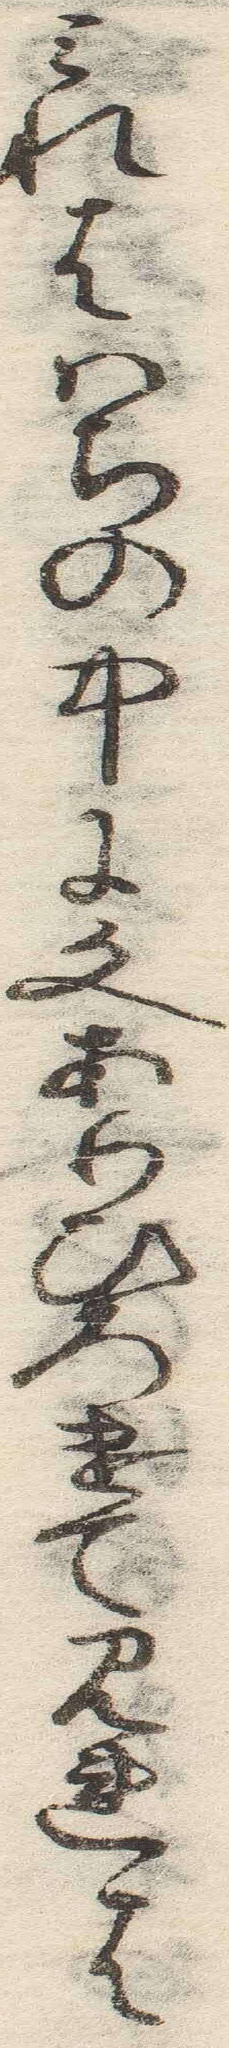みれははちの中に文ありひろけて見れは
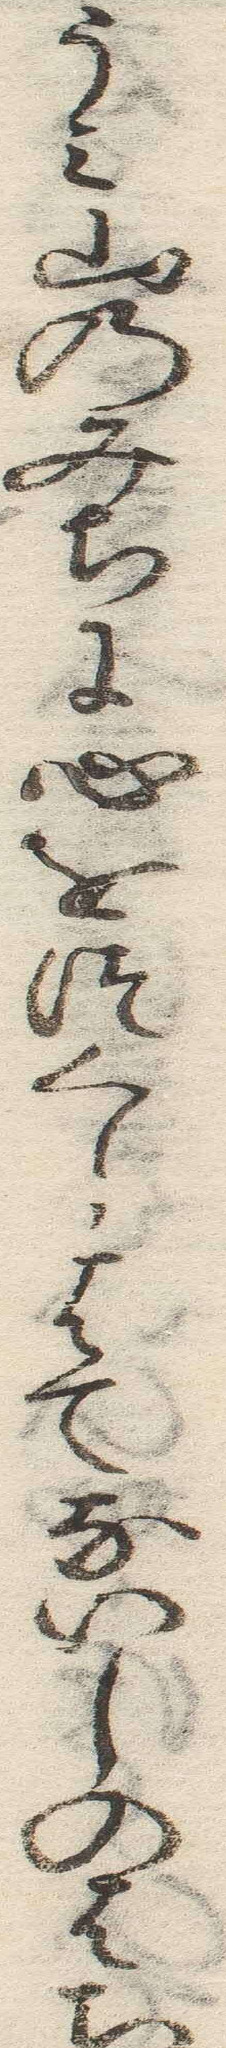うみ山のみちに心をつくしはてないしのはち
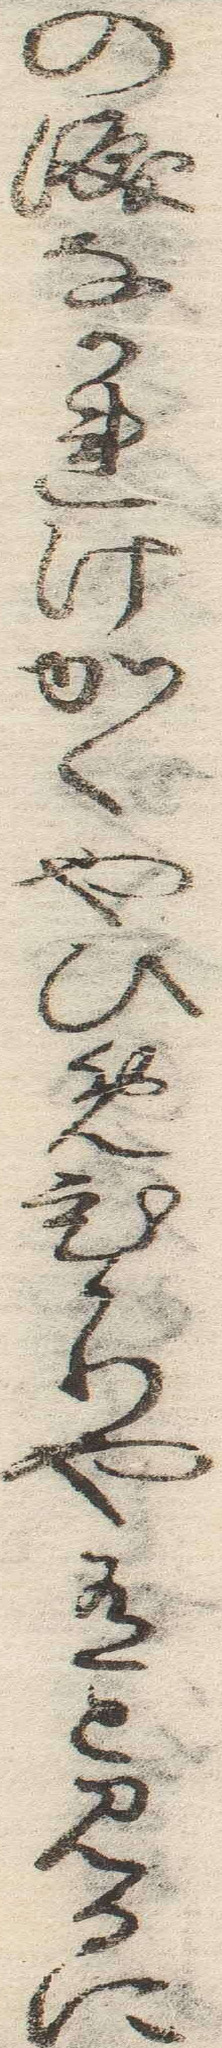の涙なかれけかくやひめひかりや有と見るに
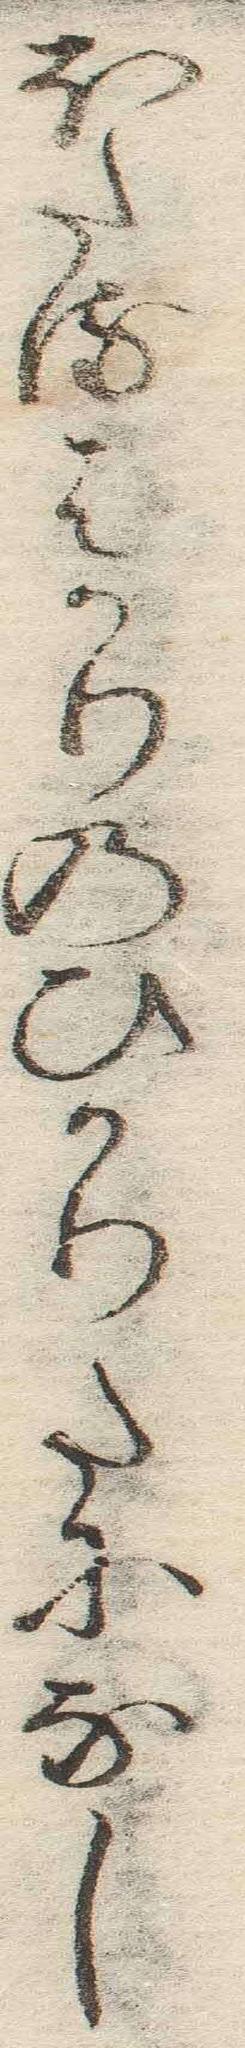ほたるはかりのひかりたになし
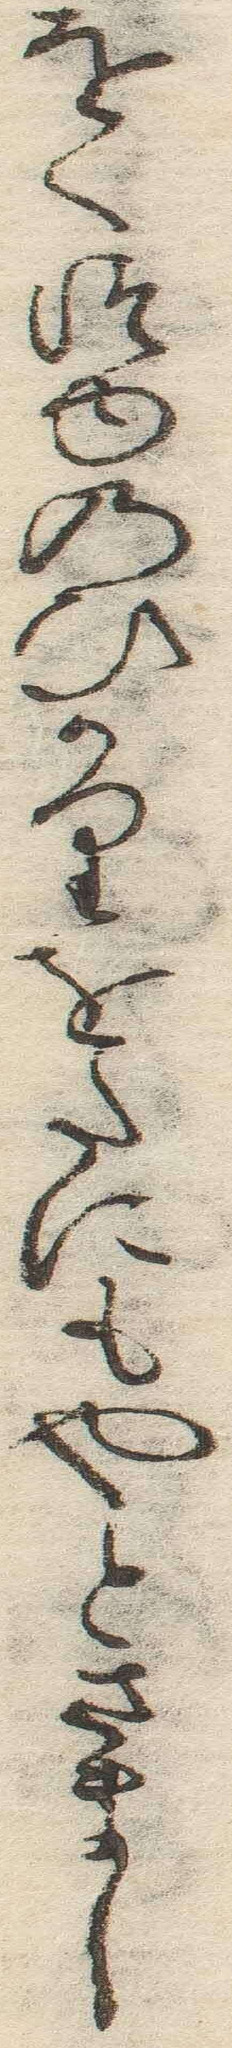をくつゆのひかりをたにもやとさまし
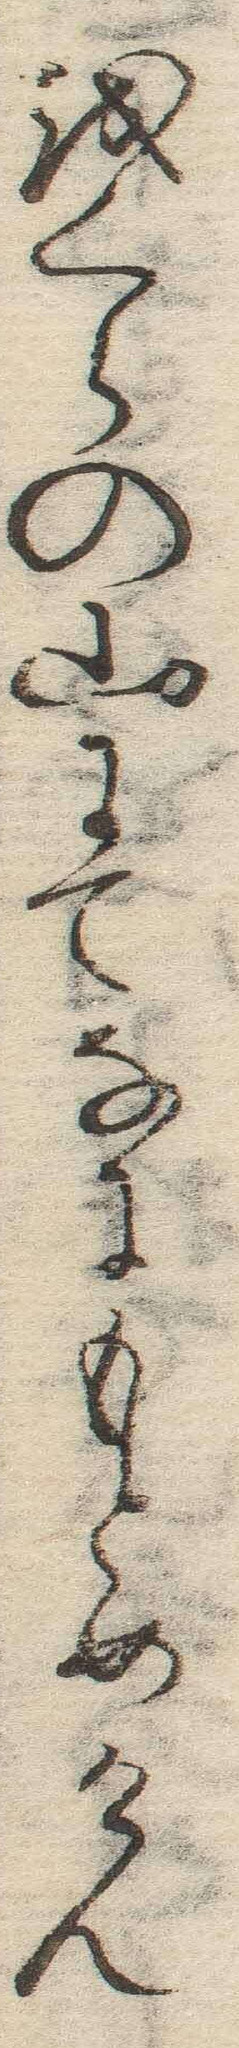をくらの山にてなにもとめけん

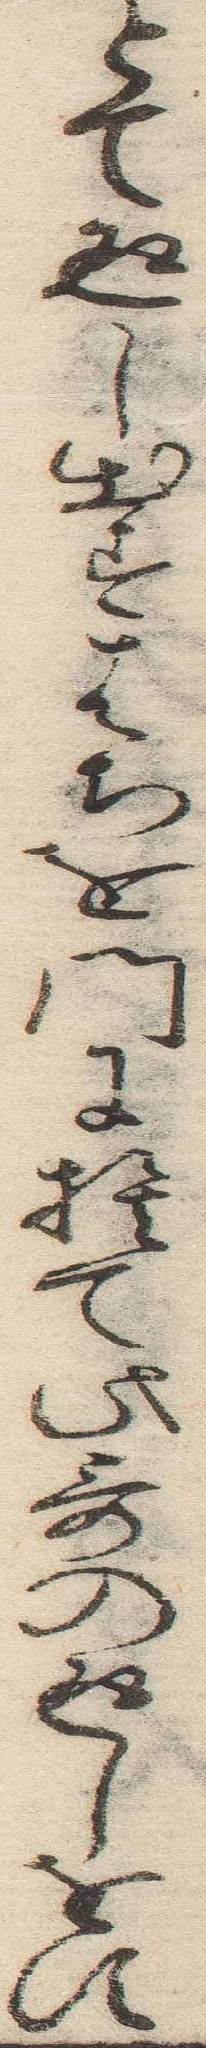とて返し出すはちを門に捨て此歌の返しをす
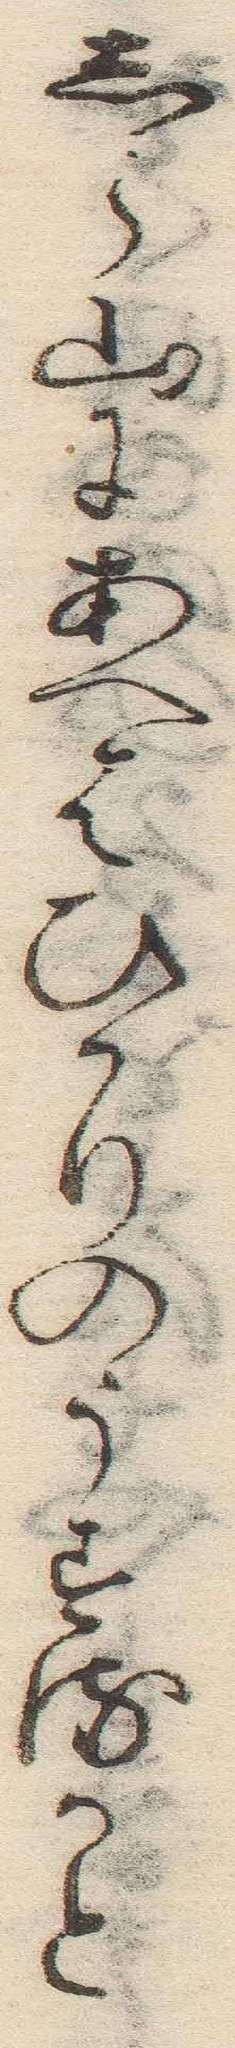しら山にあへはひかりのうするかと
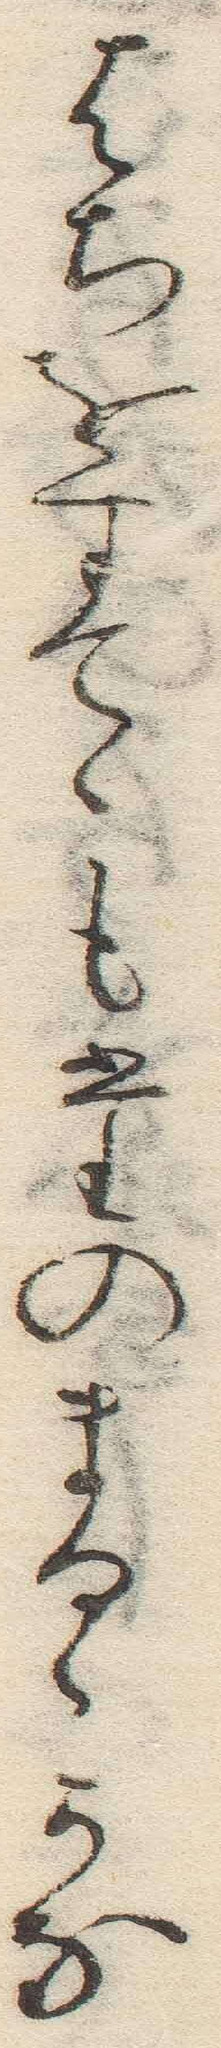はちをすてゝもたのまるゝかな
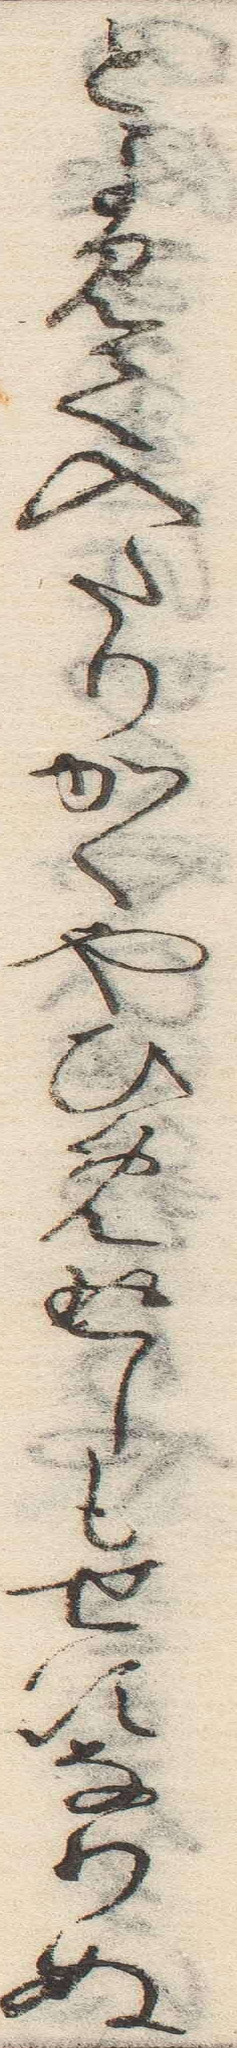とよみて入たりかくやひめ返しもせすなりぬ
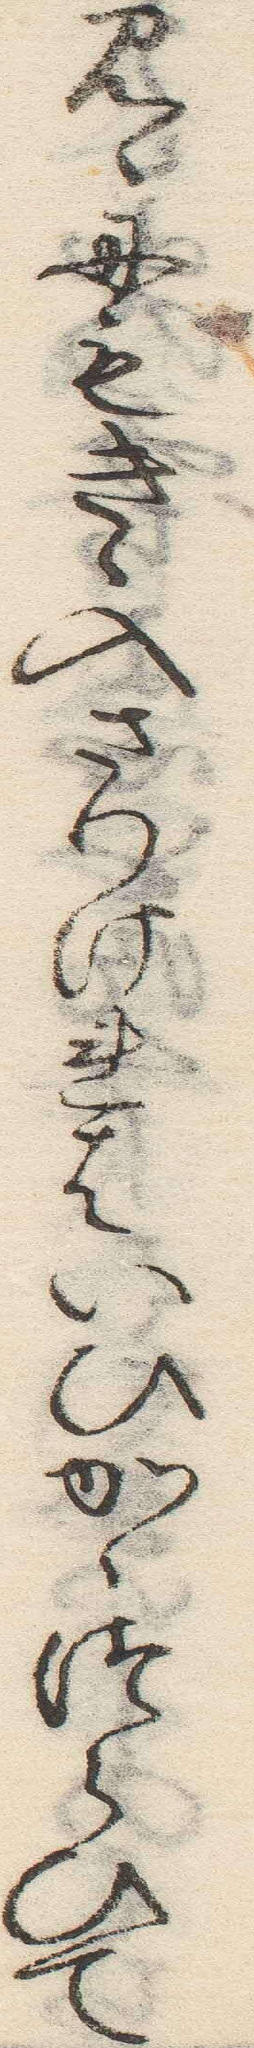みゝにもきゝ入さりけれはいひかゝつらひて
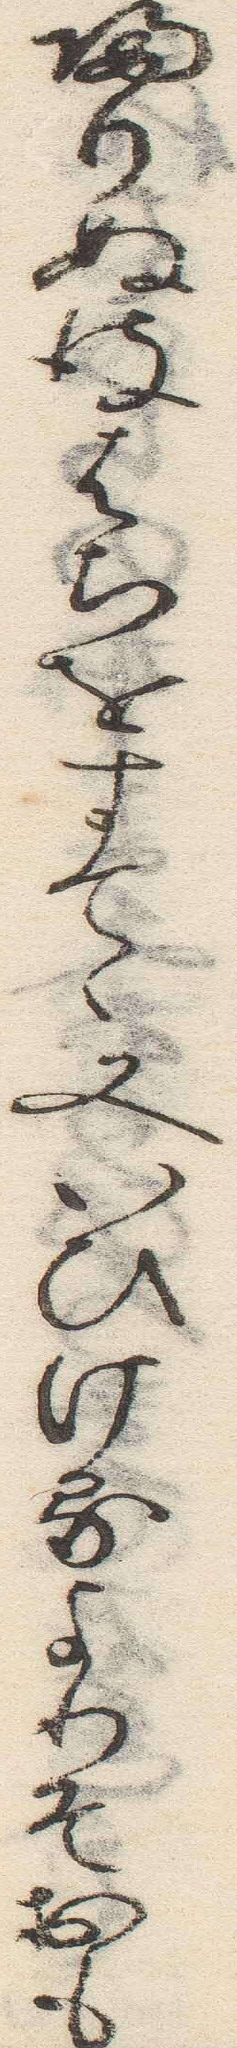帰りぬ彼はちをすてゝ又いひけるよりそおも
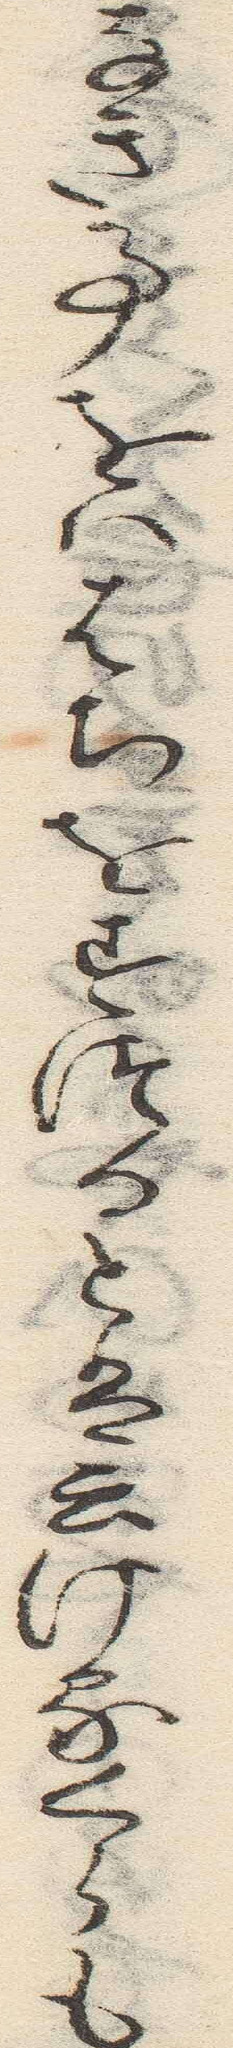なき事をははちをすつるとは云けるくらも
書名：竹取物語
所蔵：東京学芸大学附属図書館 国文学研究資料館
